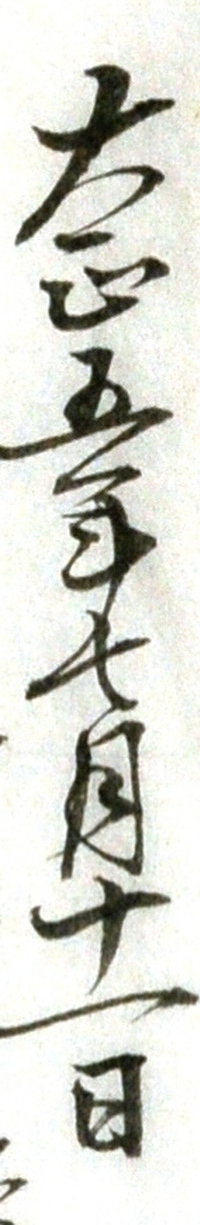大正五年七月十一日
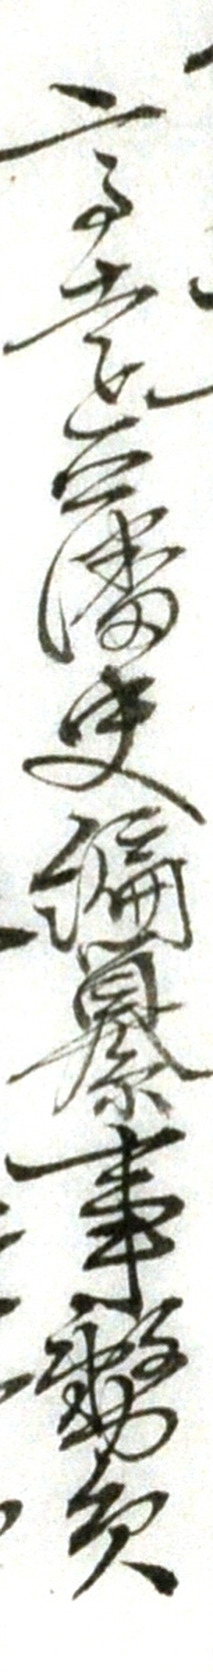高遠藩史編纂事務員
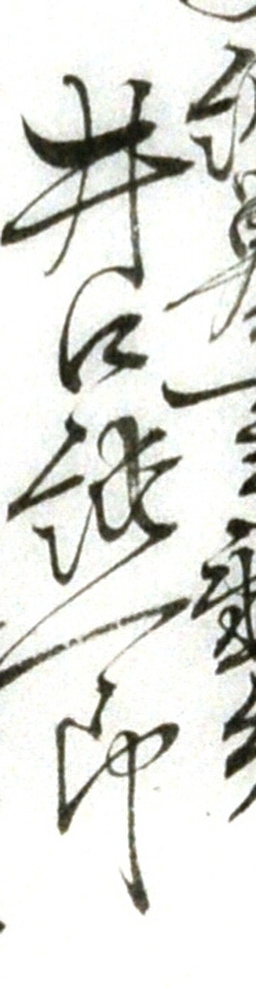井口純一郎
